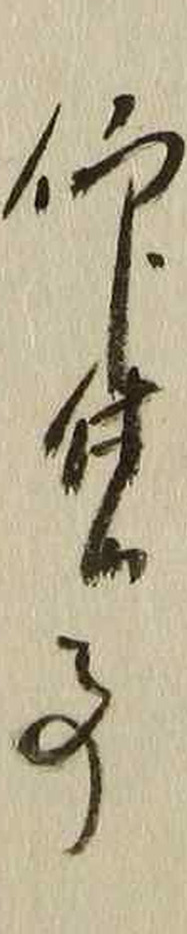仰付候事
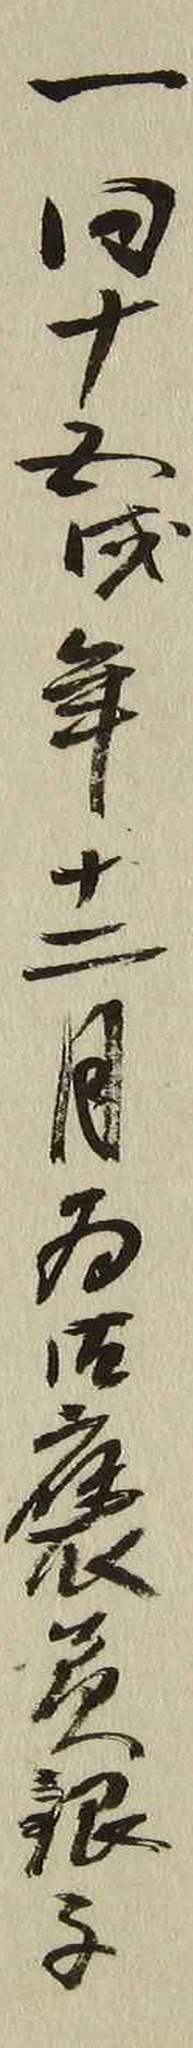一同十五戌年十二月為御褒美銀子
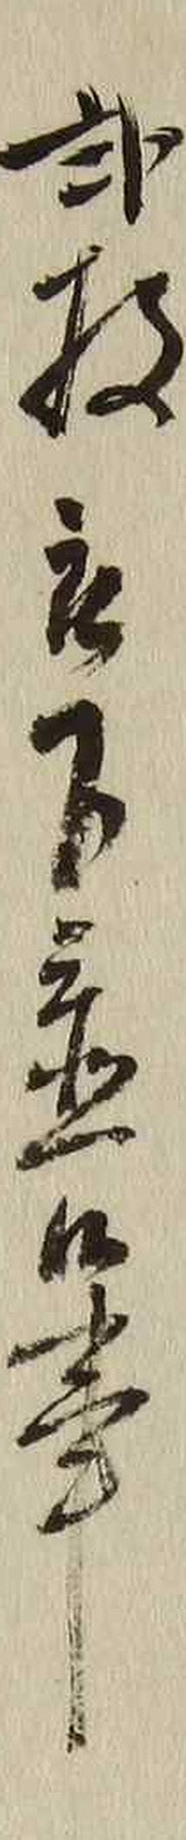弐枚被下置候事
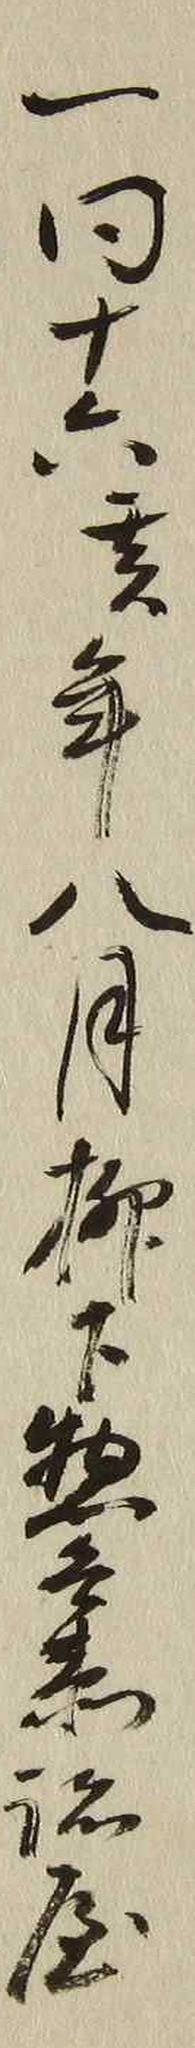一同十六亥年八月柳下惣兵衛跡屋
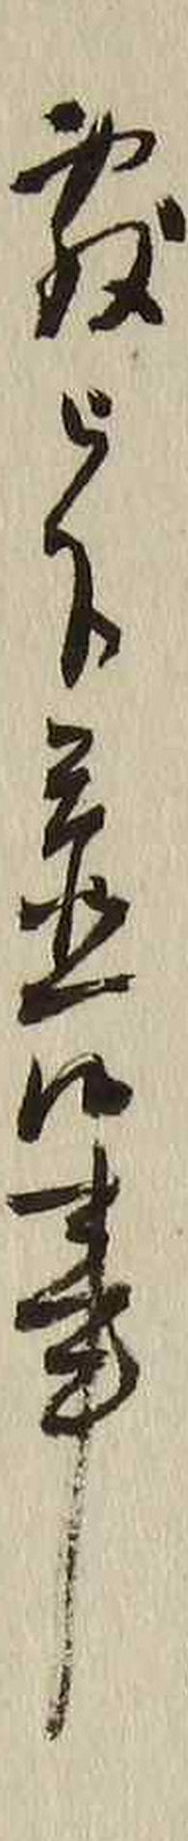敷被下置候事
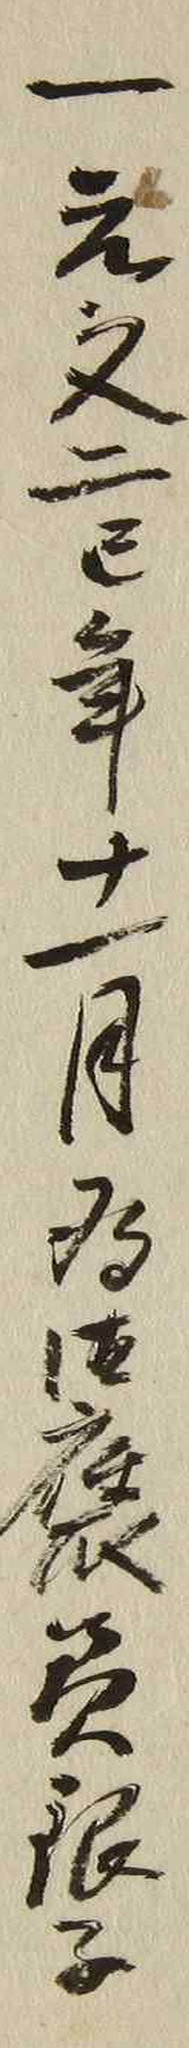一元文二巳年十一月為御褒美銀子
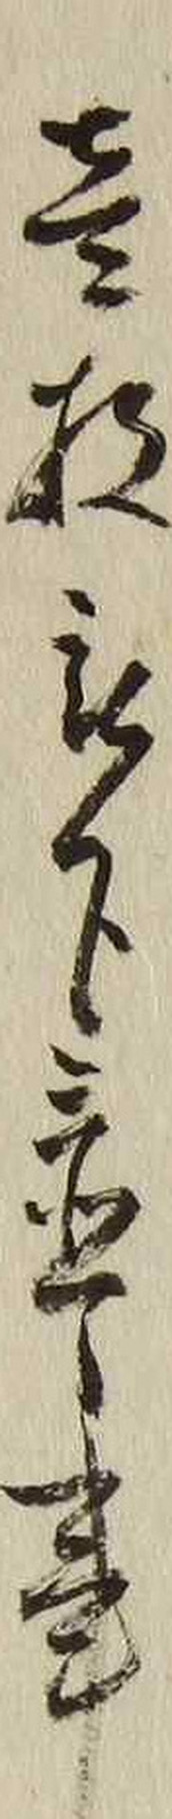壱枚被下置候事
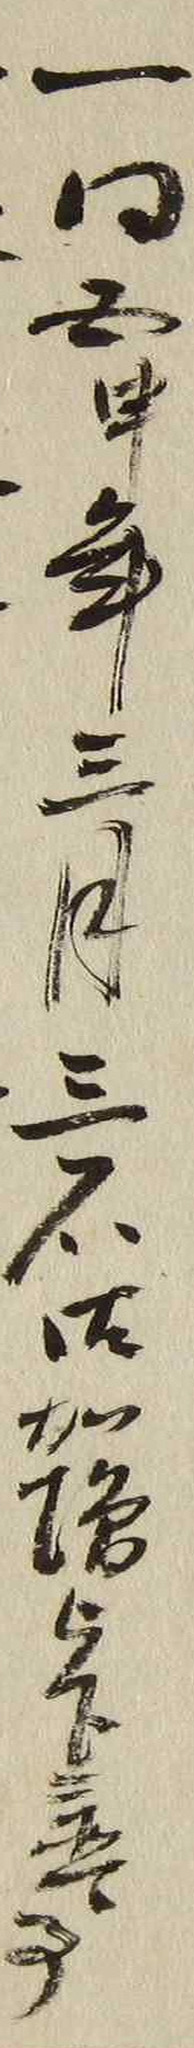一同五申年三月三石御加増被下置候事
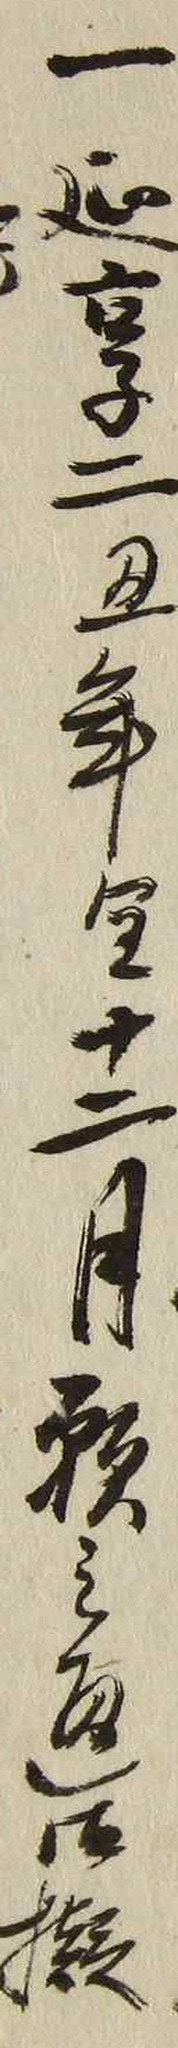一延享二丑年閏十二月願之通御擬
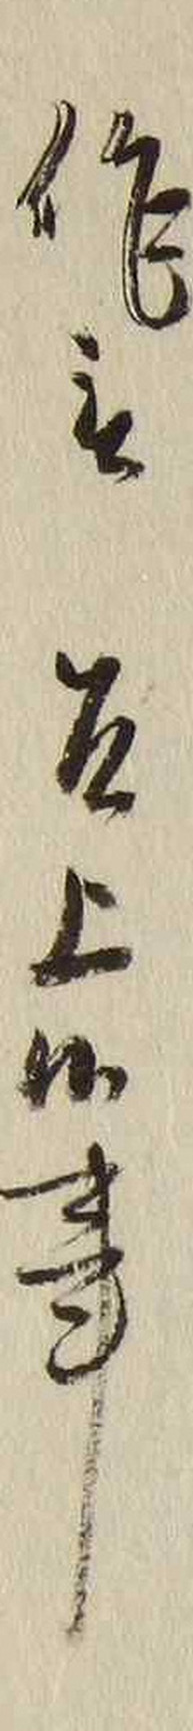作被召上候事
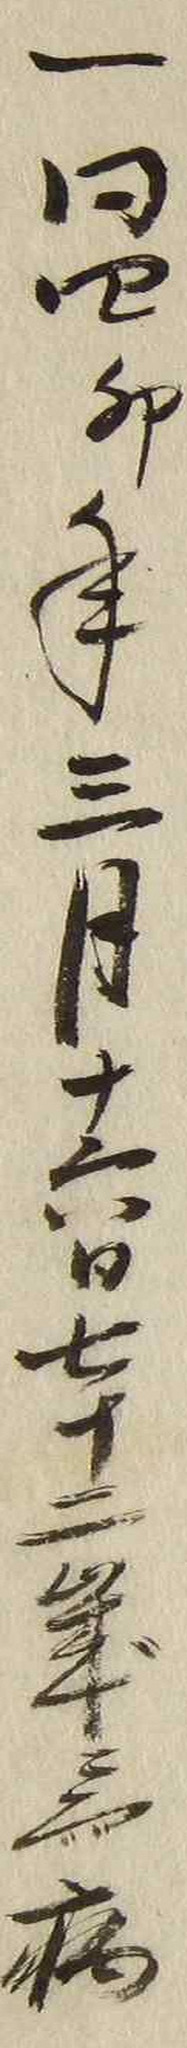一同四卯年三月十六日七十二歳に而病

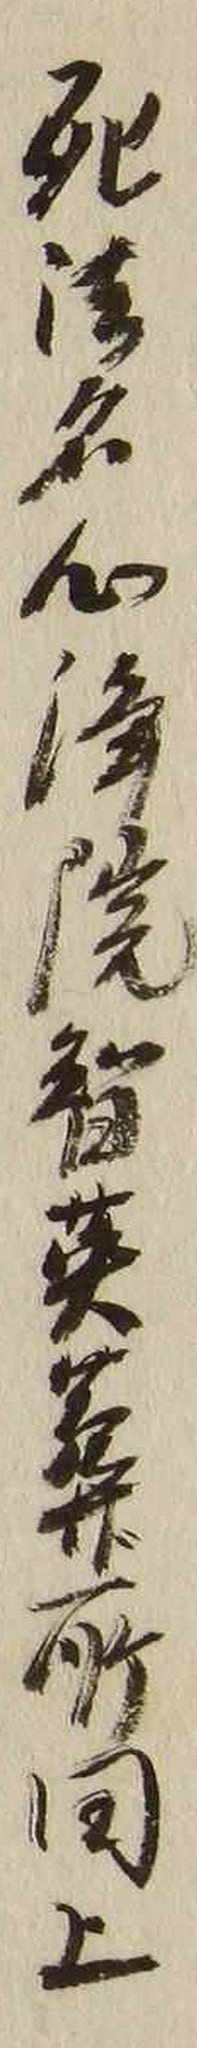死法名心浄院智英葬所同上
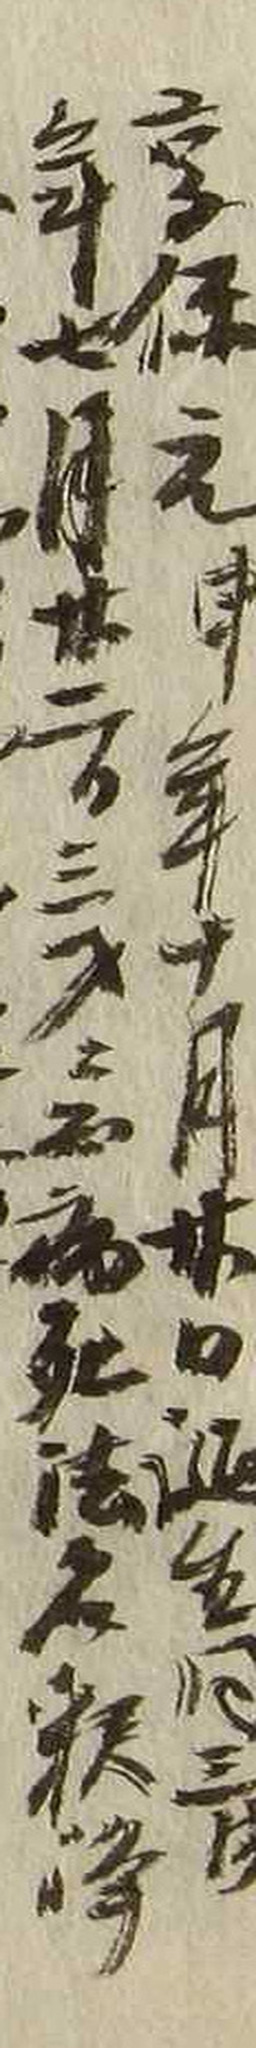年七月廿二日三才に而病死法名釈浄
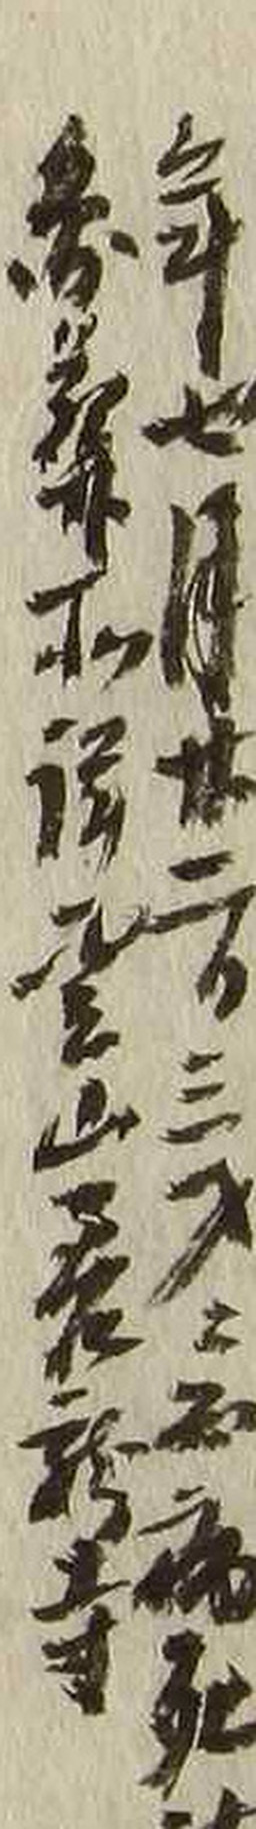円葬所祥雲山善龍寺
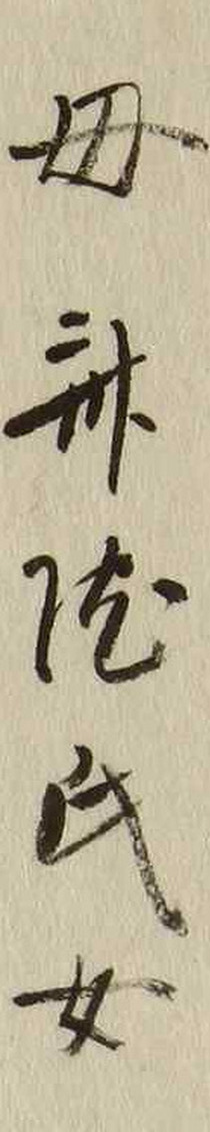母斉院氏女
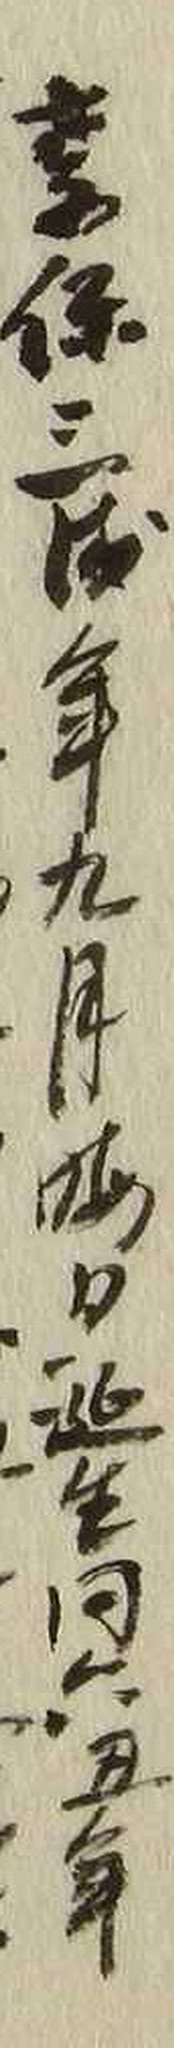女享保三戌年九月晦日誕生同六丑年
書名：諸士系譜　巻之360　す之部10
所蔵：会津若松市立会津図書館
